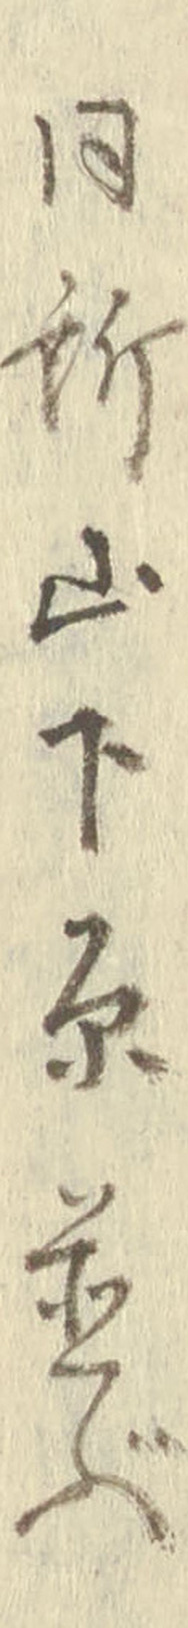同所山下原並ぶ
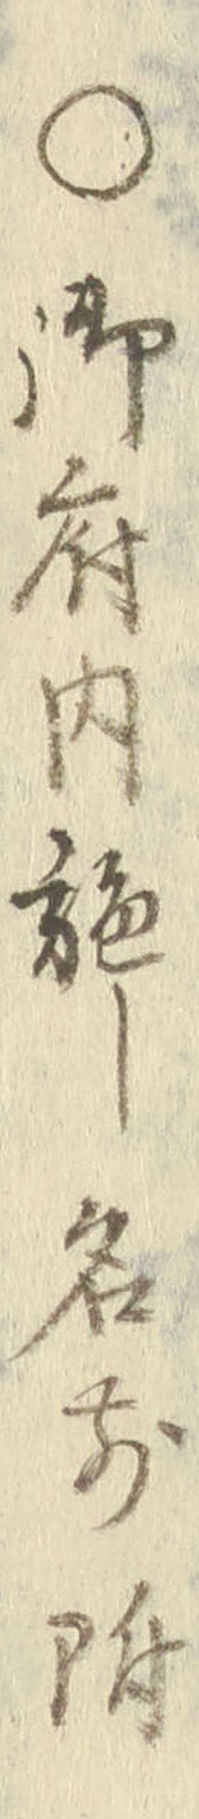◯御府内施し名前附
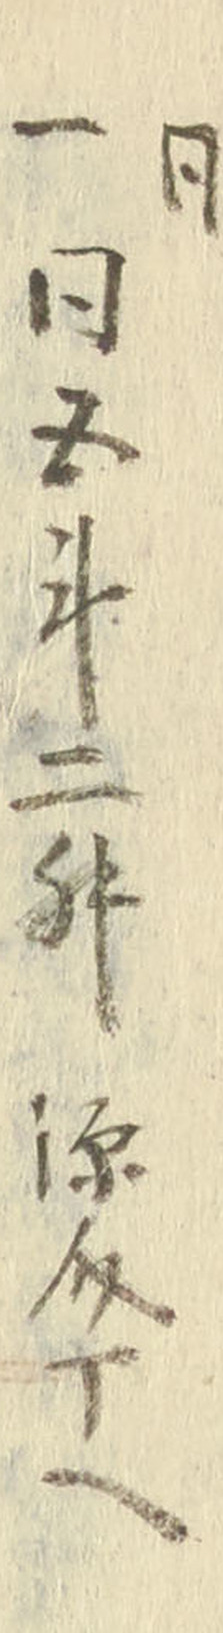一同五斗二升源介丁へ
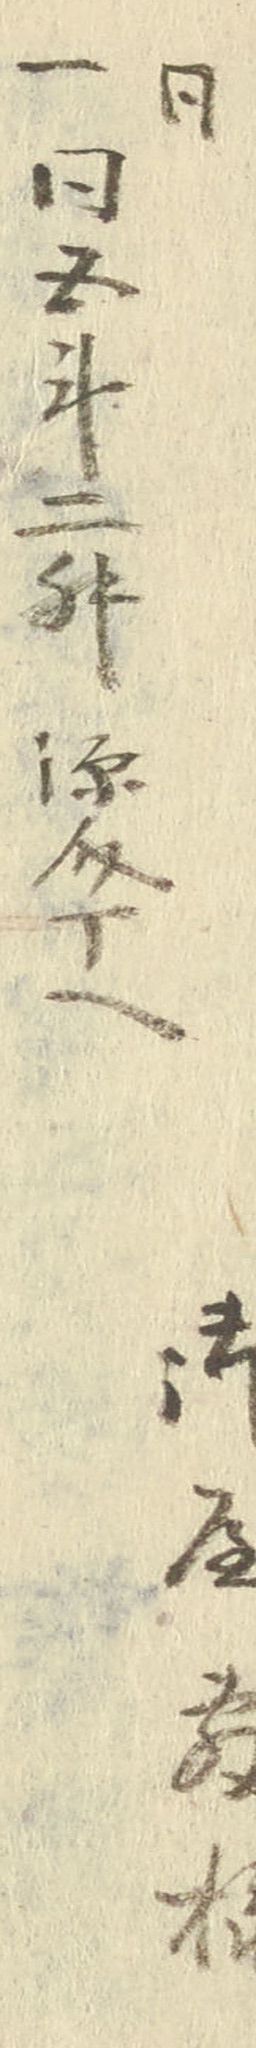一同五斗二升源介丁へ
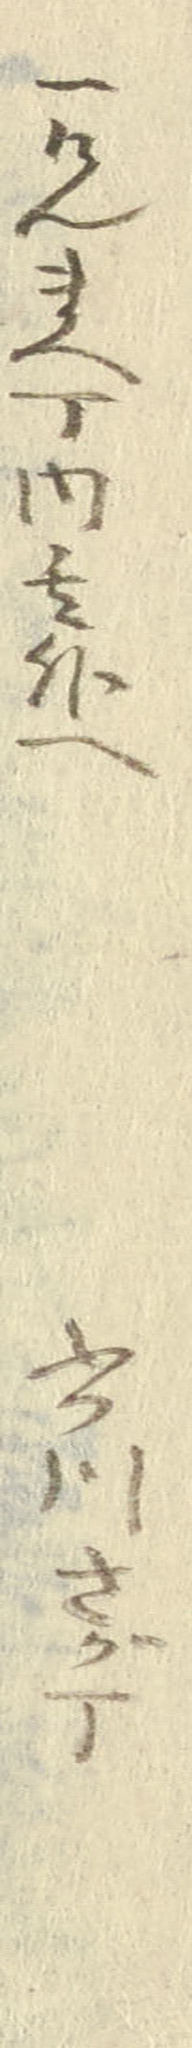一けんまへ丁内其外へふか川さが丁
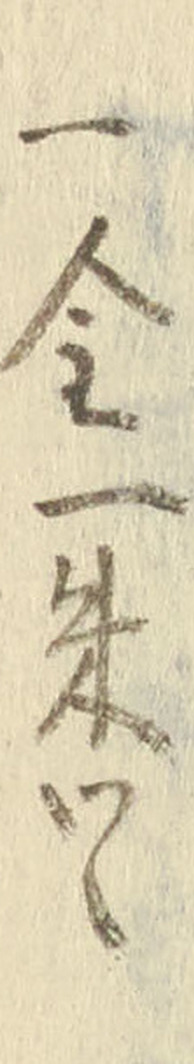一同弐朱ツヽ
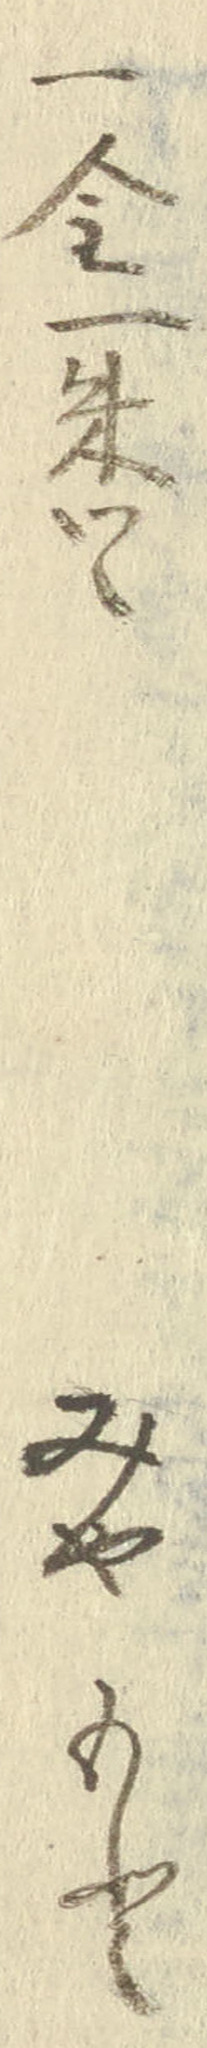一金一朱ツヽみやもと
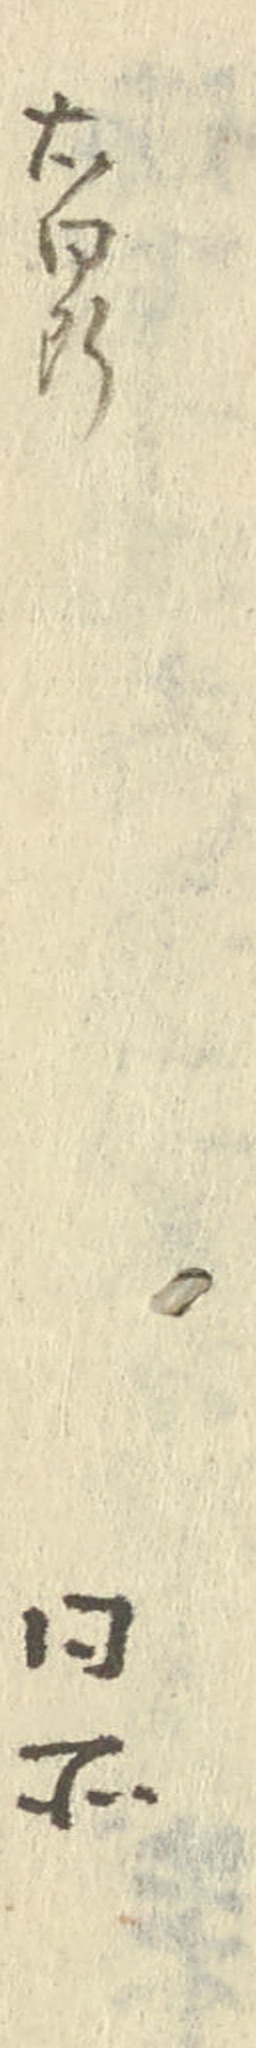右同断同所
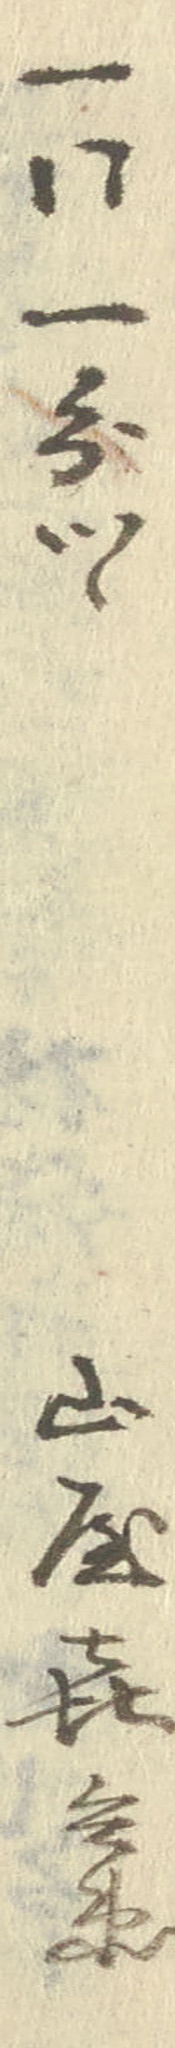一同一分ツヽ山屋㐂兵衛
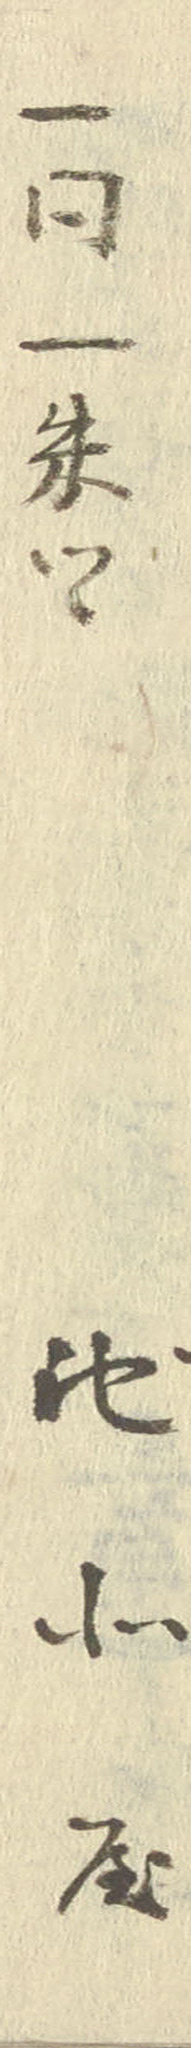一同一朱ツヽ池北屋
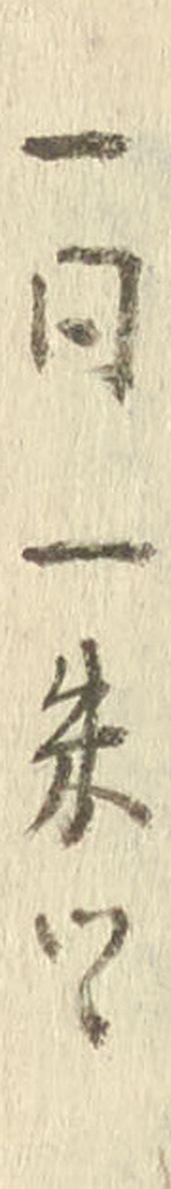一同弐朱ツヽ
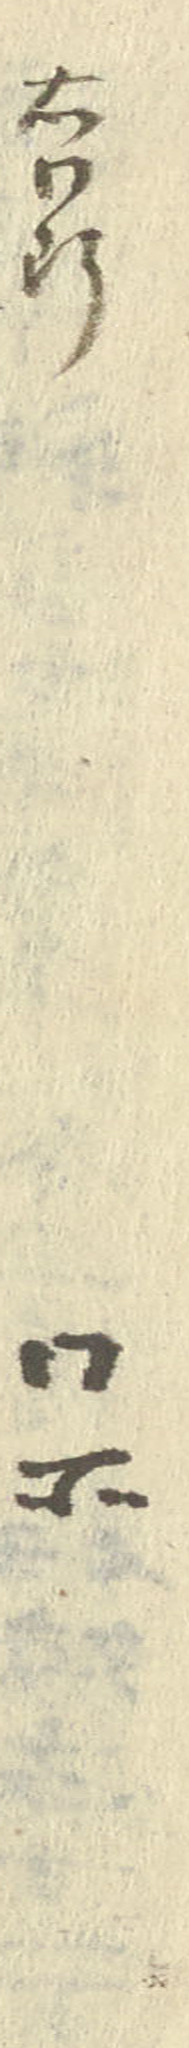右同断同所
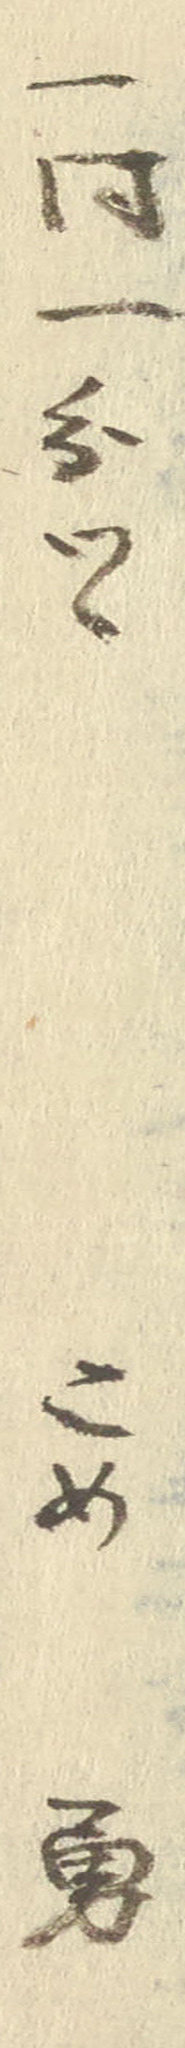一同一分ツヽこめ勇
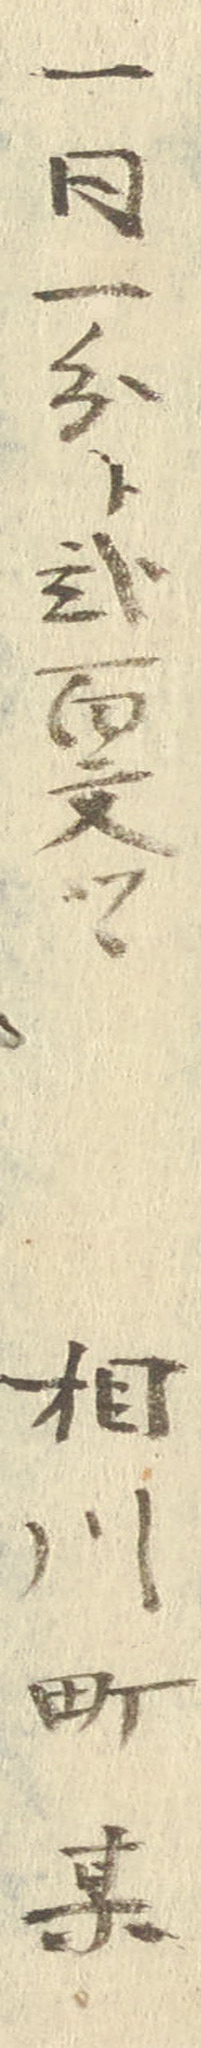一同一分ト弐百文ツヽ相川町某
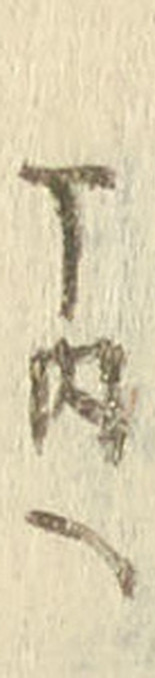丁内へ
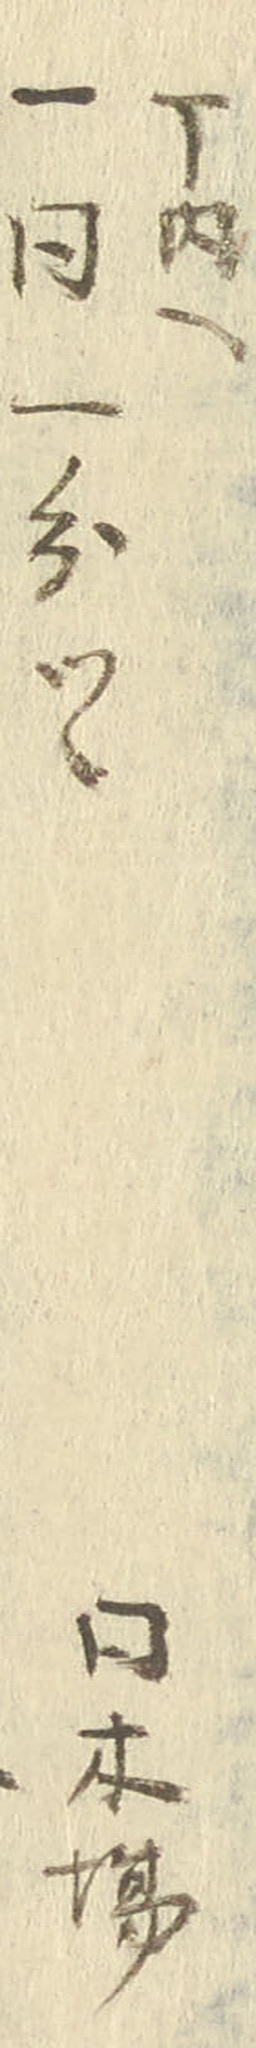一同一分ツヽ同木場
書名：御府内御屋敷方市中共地震類焼場所明細書之冩兼街道筋近郷聞書
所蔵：東京大学総合図書館 General Library in the University of Tokyo, JAPAN
